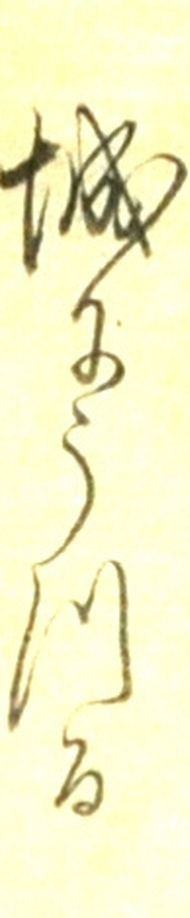城にうつる
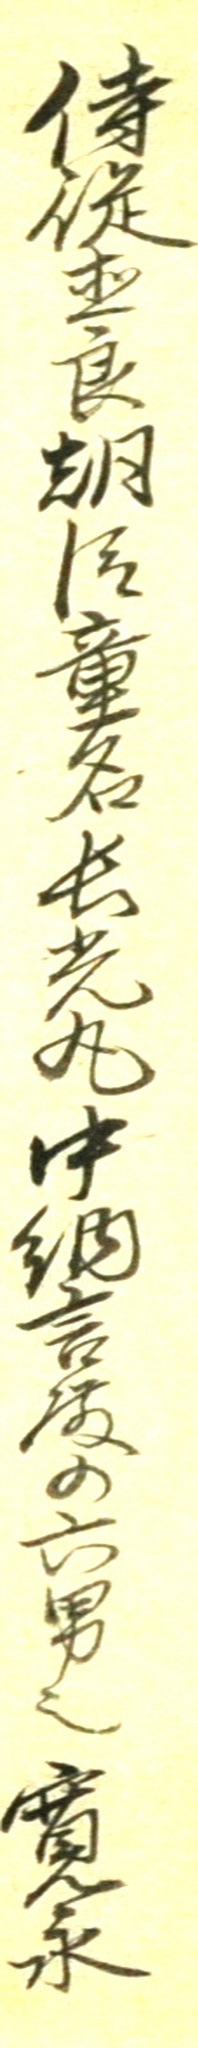侍従直良朝臣童名長光丸中納言殿の六男也寛永
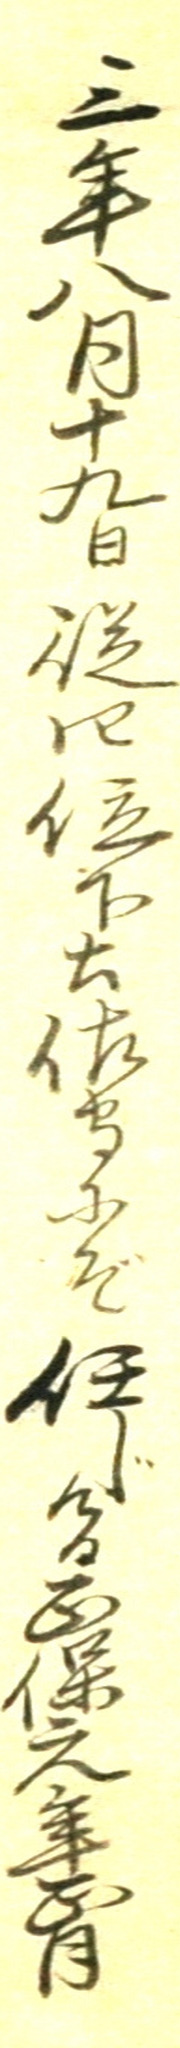三年八月十九日従四位下土佐守にそ任じける正保元年正月
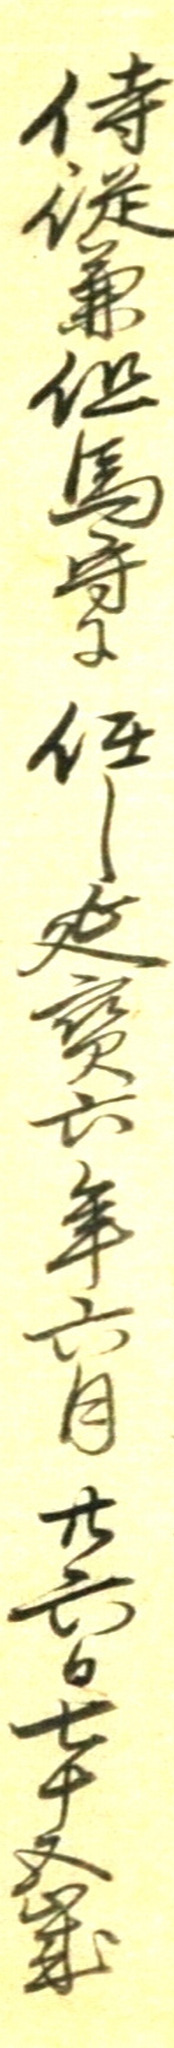侍従兼但馬守に任し延宝六年六月廿六日七十五歳
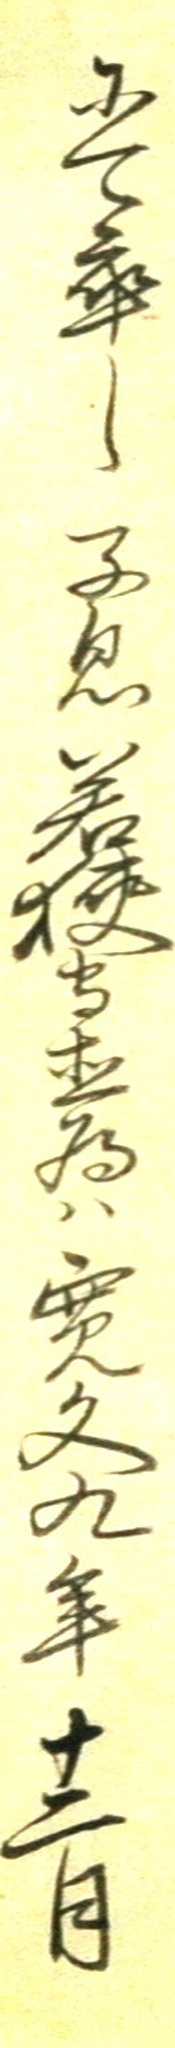にて卒し子息若狭守直為は寛文九年十二月
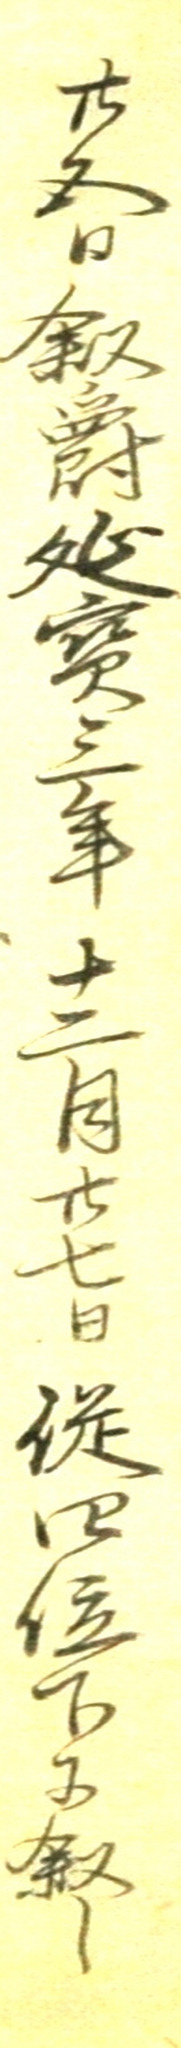廿五日叙爵延宝三年十二月廿七日従四位下に叙し
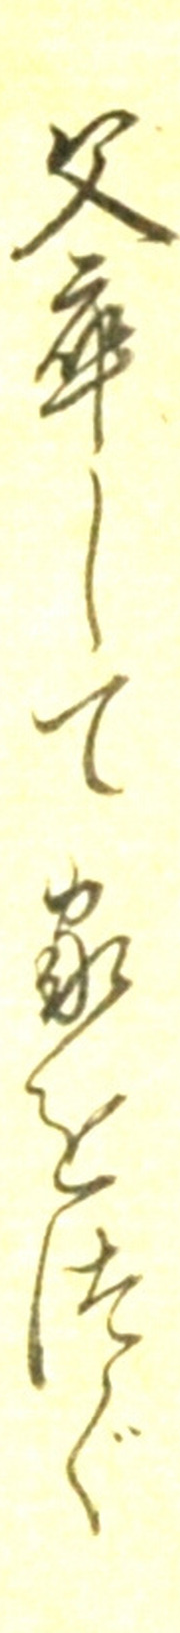父卒して家をつく

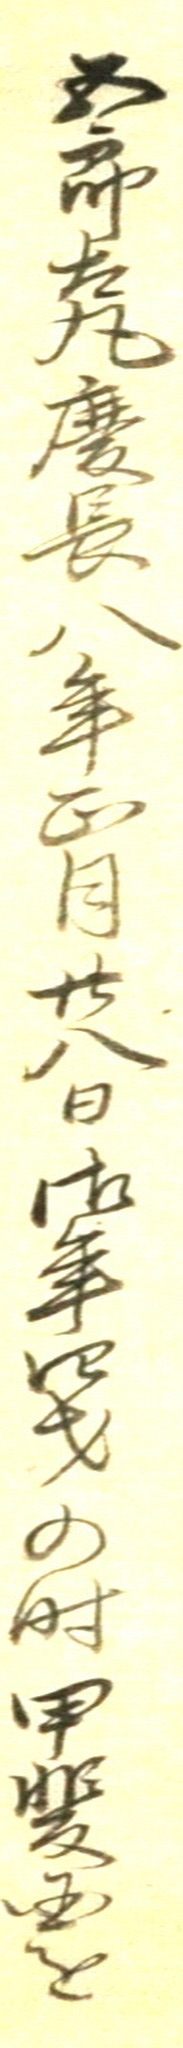五郎太丸慶長八年正月廿八日御年四才の時甲斐国を
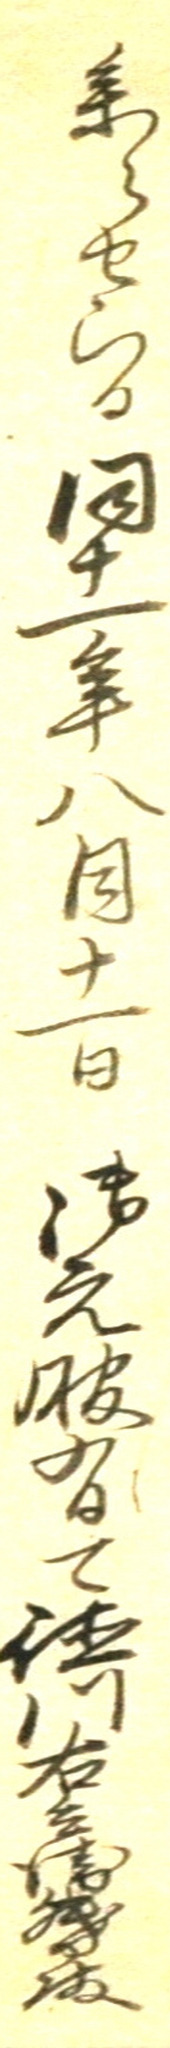参らせらる同十一年八月十一日御元服有て徳川右兵衛督殿
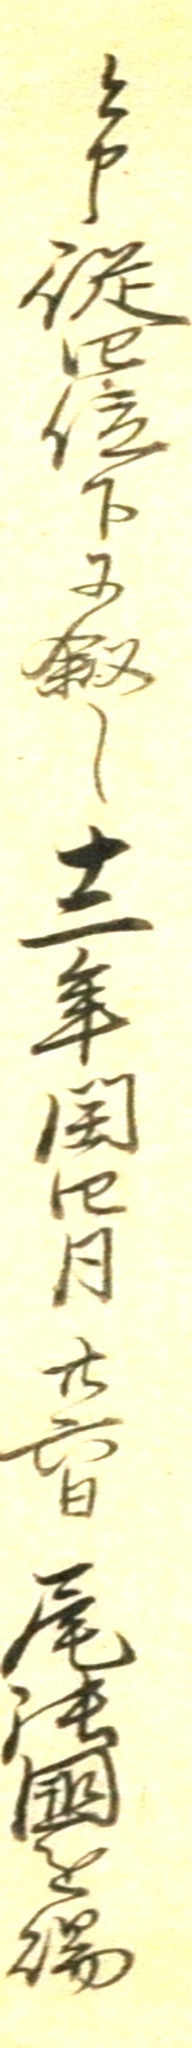と申従四位下に叙し十二年閏四月廿六日尾張国を賜

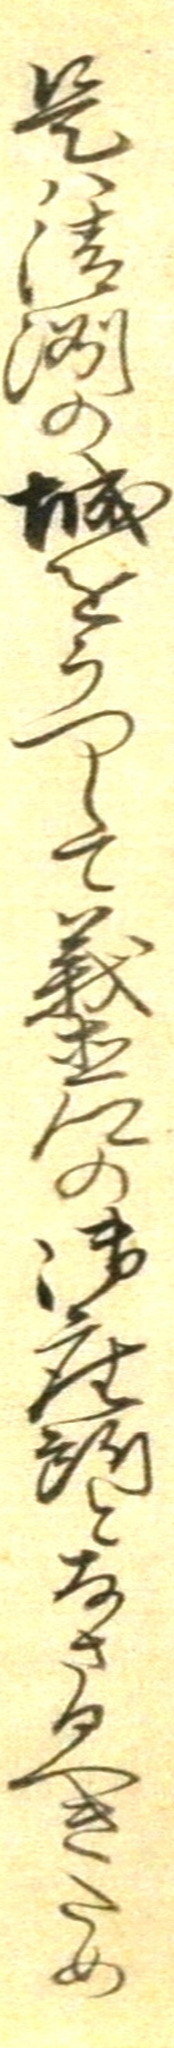是は清洲の城をうつして義直卿の御座所となさるへきため
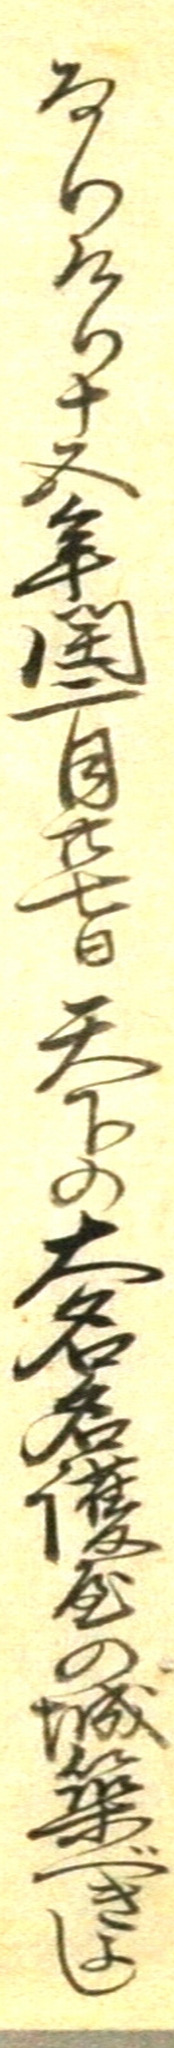なりけり十五年閏二月廿七日天下の大名名護屋の城築べきよし
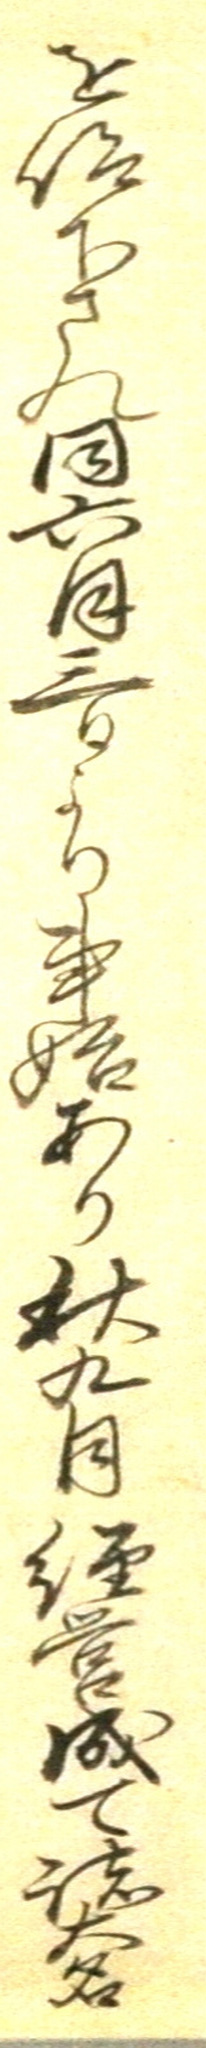を仰下され同六月三日より事始あり秋九月経営成て諸大名
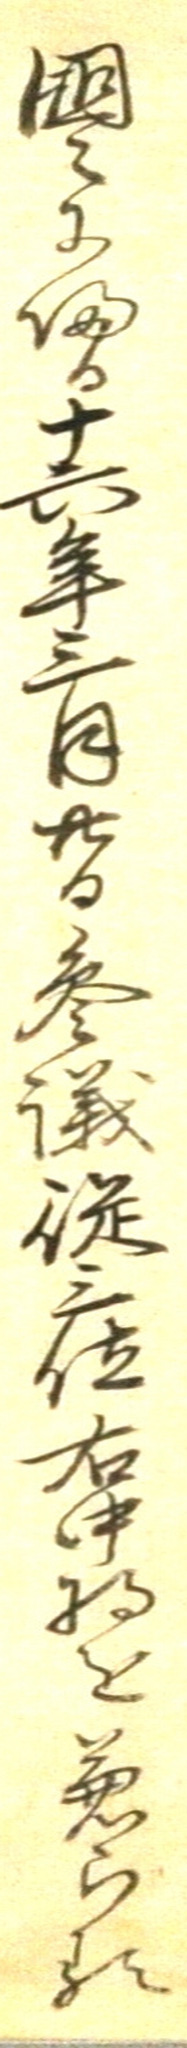国々に帰る十六年三月廿日参議従三位右中将を兼らる
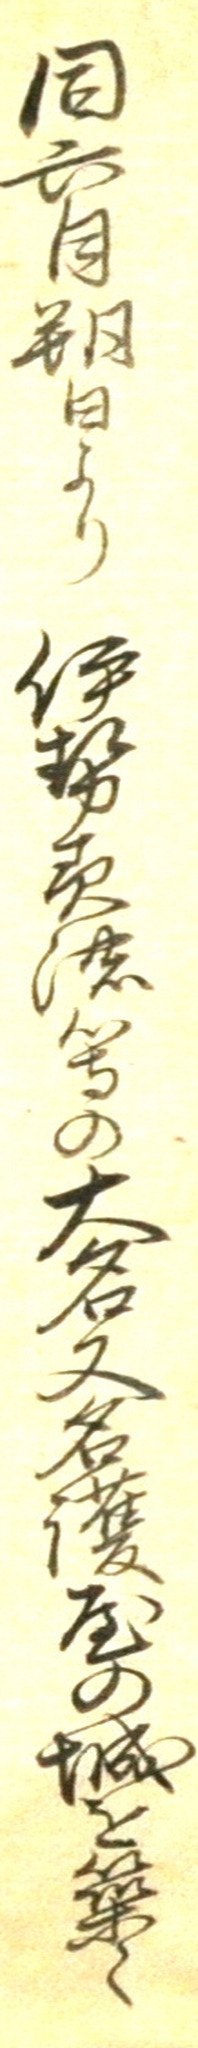同六月朔日より伊勢美濃等の大名又名護屋の城を築く
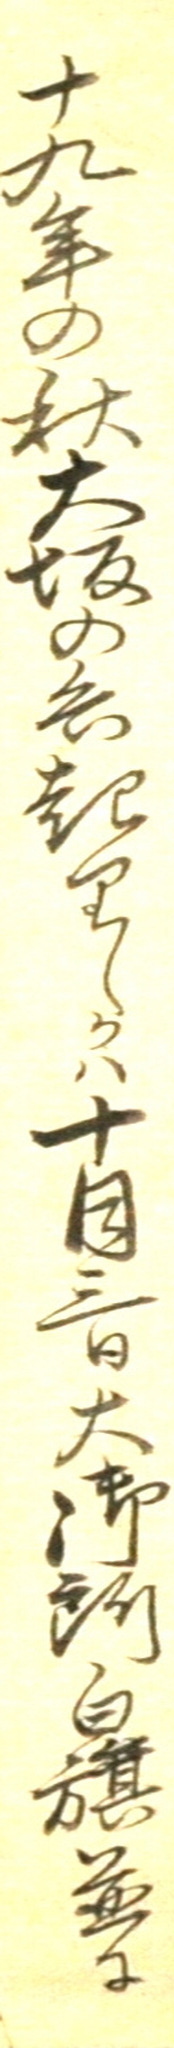十九年の秋大坂の兵起りしかは十月三日大御所白旗並に
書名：藩翰譜（一）
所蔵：伊那市立高遠町図書館・合同会社AMANE
